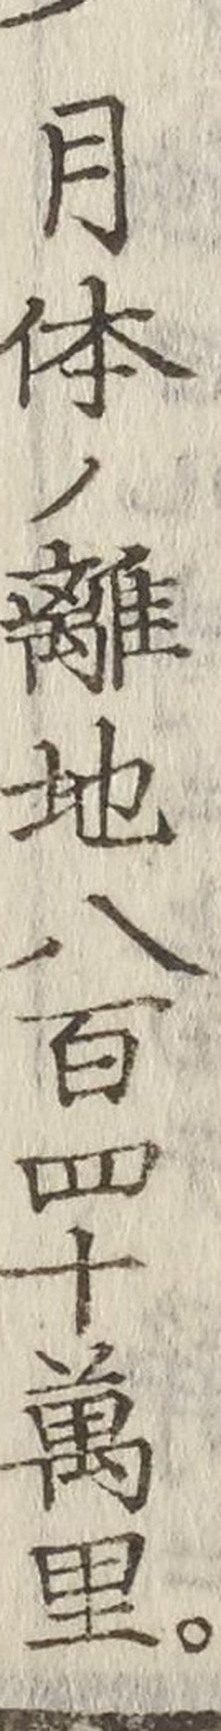月体ノ離地八百四十万里。
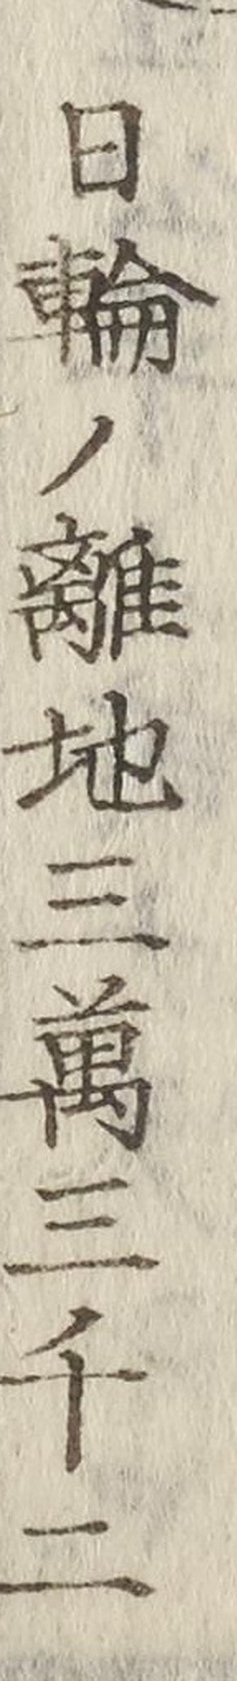日輪ノ離地三万三千二
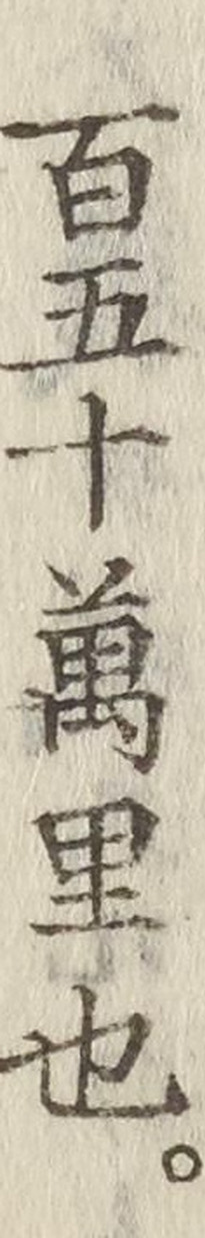百五十万里也。
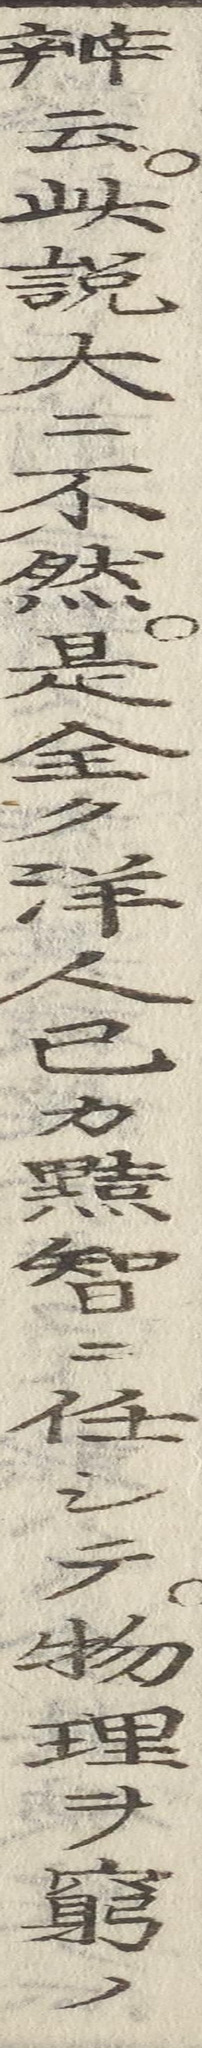弁云。此説大ニ不然。是全ク洋人己カ点智ニ任シテ。物理ヲ窮ノ
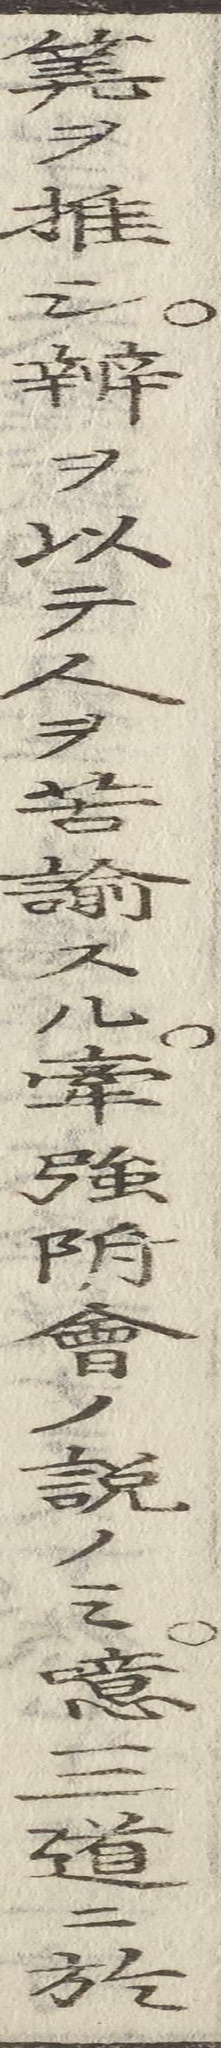算ヲ推シ。弁ヲ以テ人ヲ苦論スル。牽強付会ノ説ノミ。噫三道ニ於
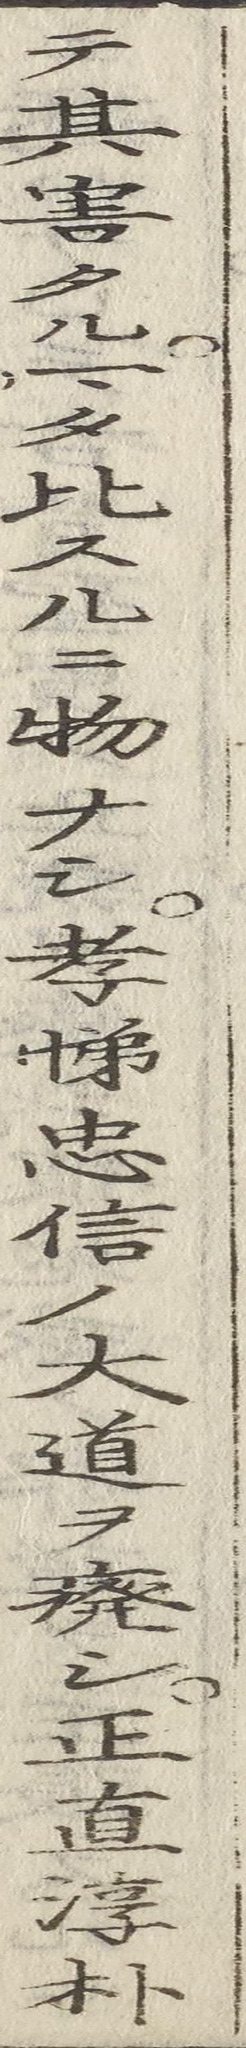テ其害タル。マタ比スルニ物ナシ。孝悌忠信ノ大道ヲ廃シ。正直淳朴
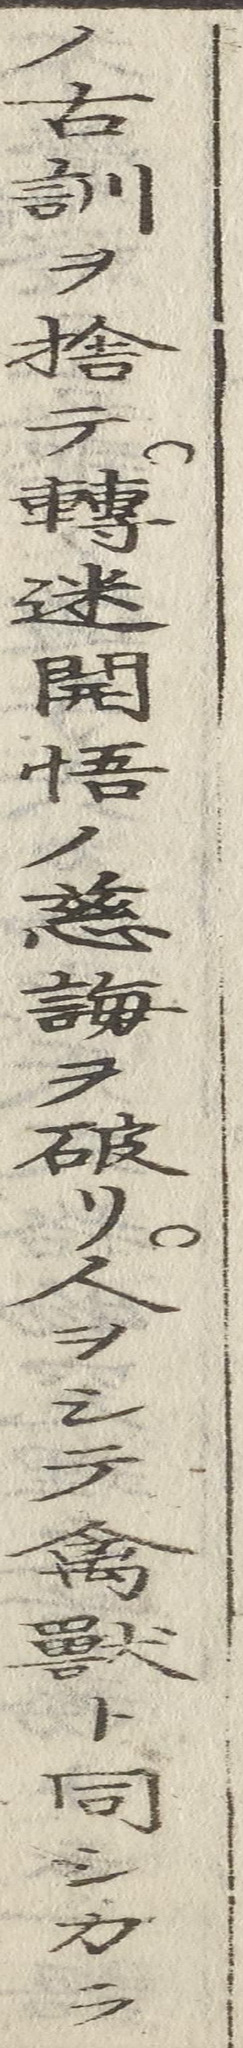ノ古訓ヲ捨テ。転迷開悟ノ慈誨ヲ破リ。人ヲシテ禽獣ト同シカラ
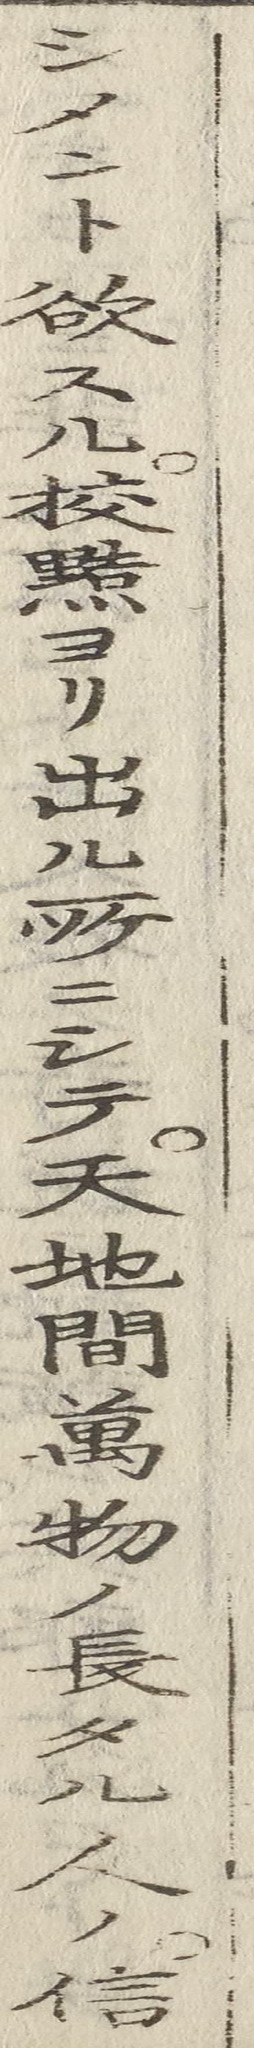シメント欲スル。校点ヨリ出ル所ニシテ。天地万物ノ長タル人々。信

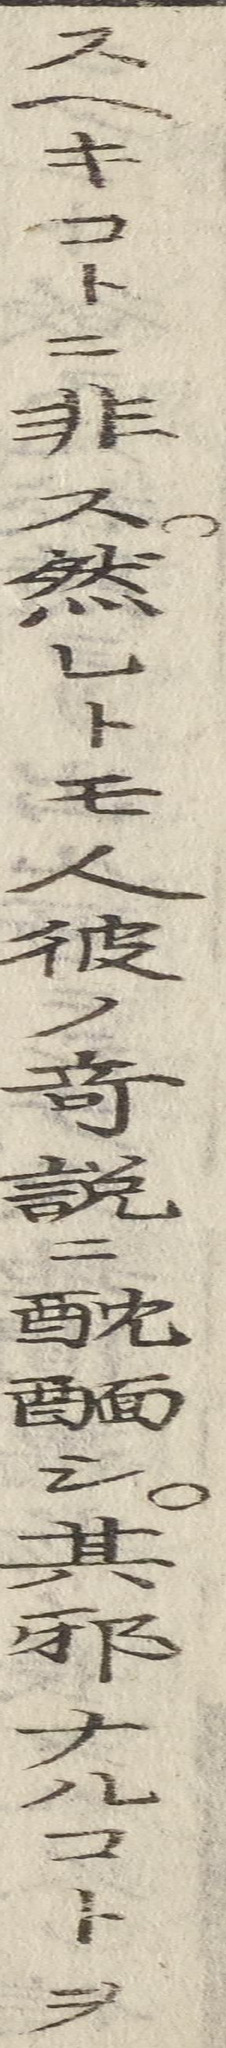スヘキコトニ非ス。然レトモ人彼ノ奇説ニ沈湎シ。其邪ナルコトヲ
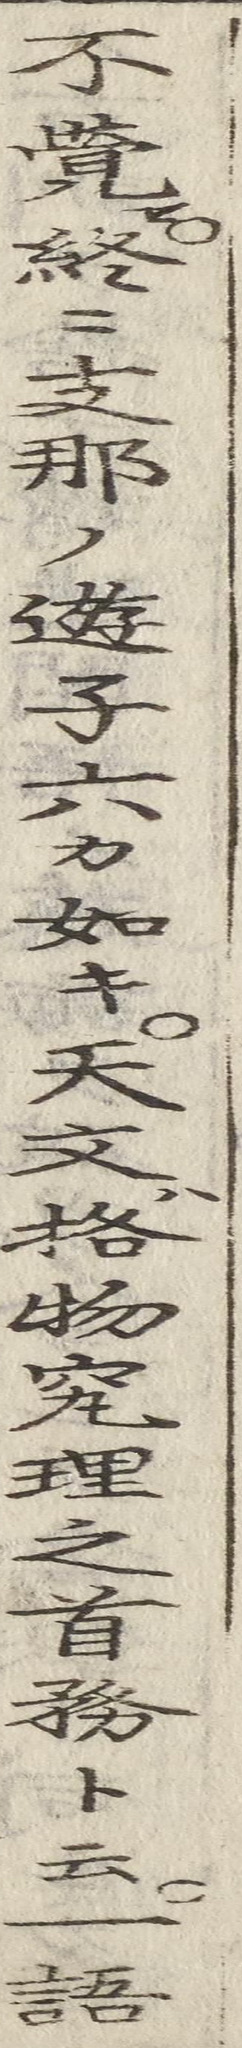不覚也。終ニ支那ノ遊子六カ如キ。天文格物究理之首務ト云。一語
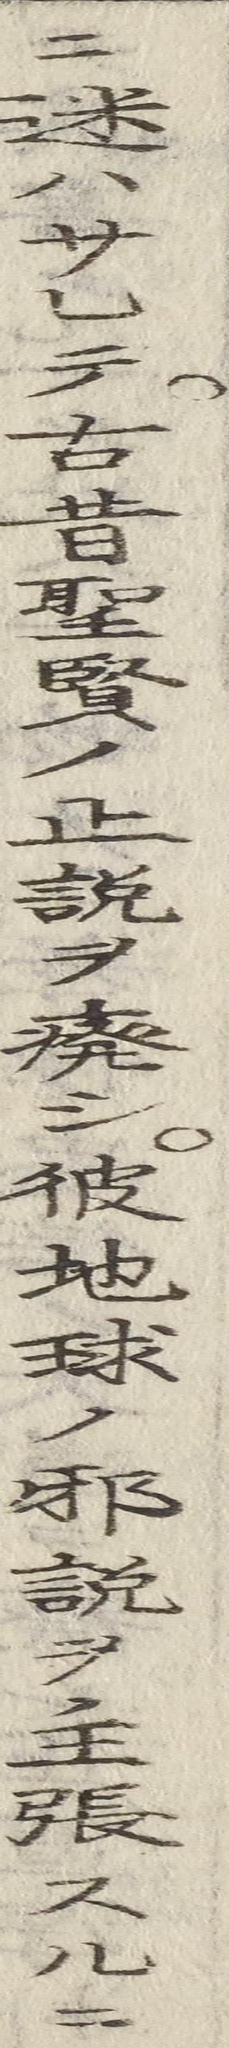ニ迷ハサレテ。古昔聖賢ノ止説ヲ廃シ。彼地球ノ邪説ヲ主張スルニ
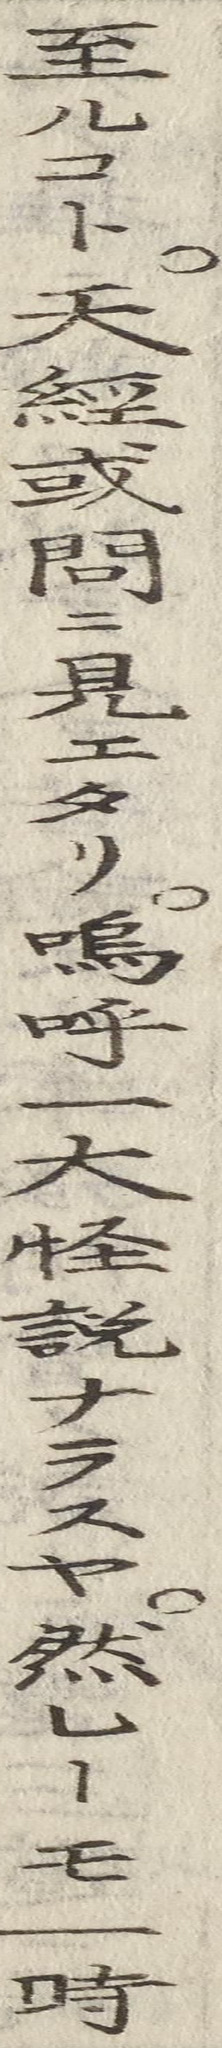至ルコト。天経或問ニ見エタリ。嗚呼一大怪説ナラスヤ。然レトモ一時
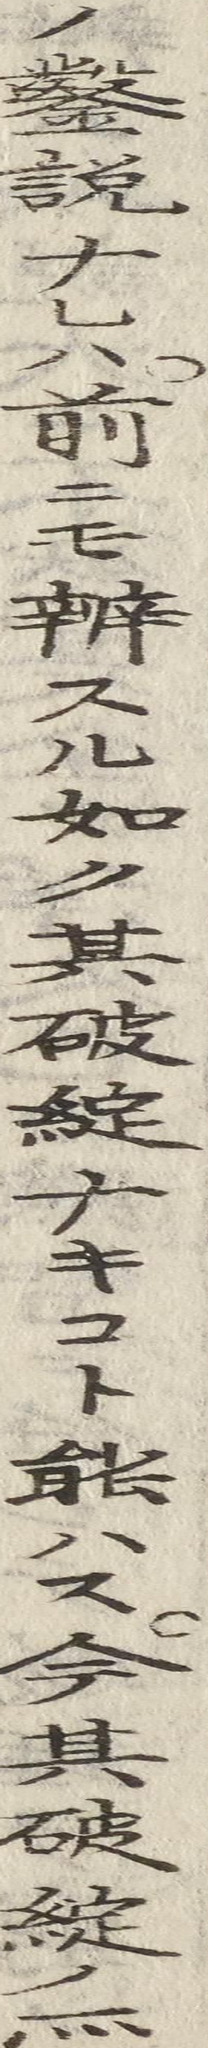ノ鑿説ナレハ。前ニモ弁スル如ク其破綻ナキコト能ハス。今其破綻ノ無
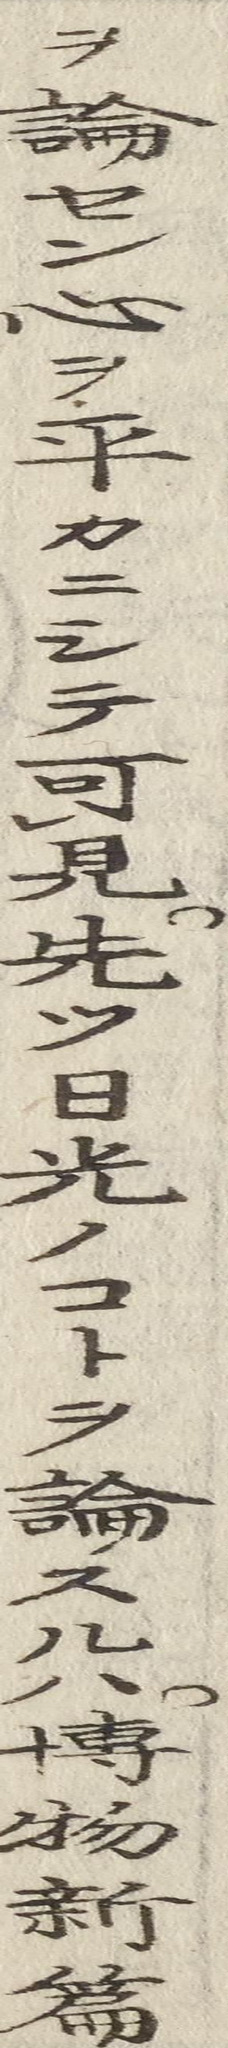ヲ論セン心ヲ乎カニシテ可見。先ツ日光ノコトヲ論スルハ。博物新篇
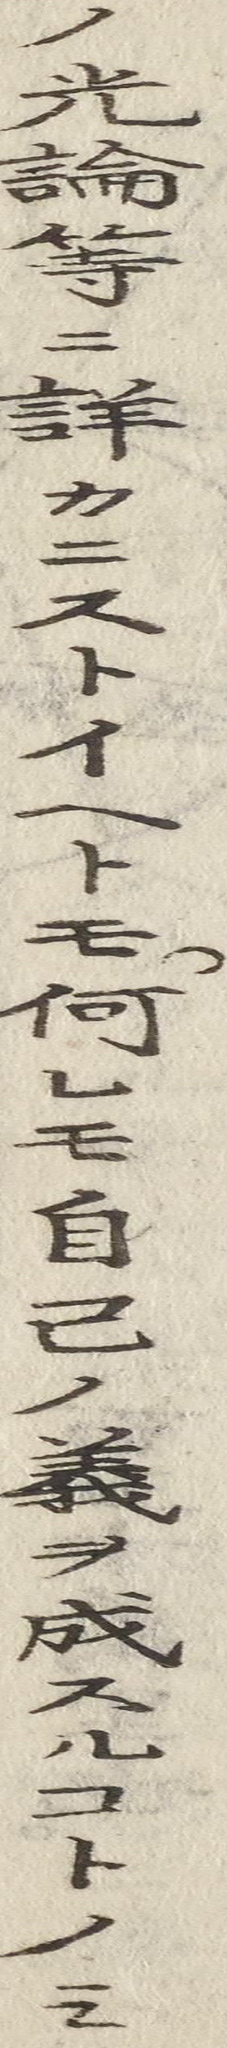ノ光輪等ニ詳カニストイヘトモ。何レモ自己ノ義ヲ成スルコトノミ
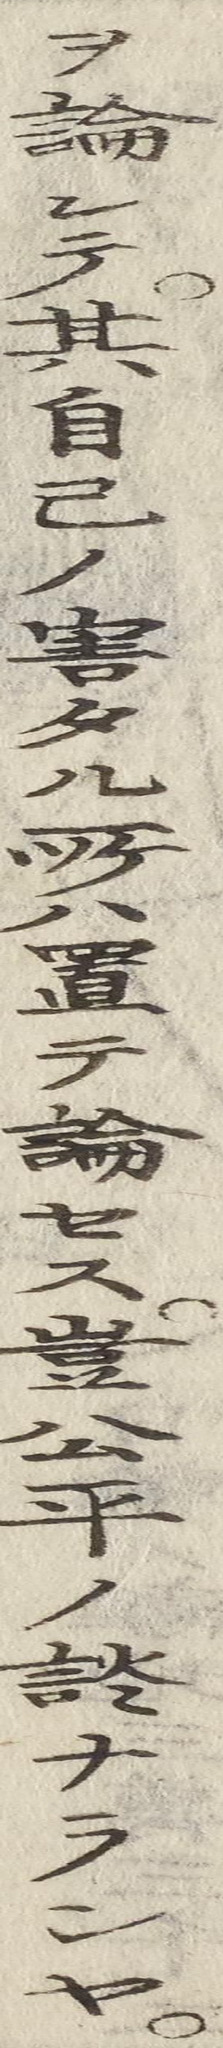ヲ論シテ。其自己ノ害タル所ハ置テ論セス。豈公平ノ談ナランヤ。
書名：護法新論　中
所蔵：東京大学地震研究所図書室 Earthquake Research Institute Library, The University of Tokyo, JAPAN
